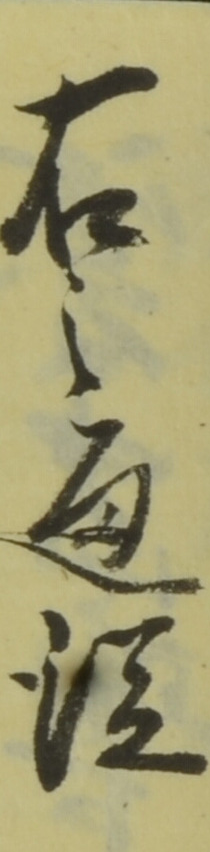右之通従
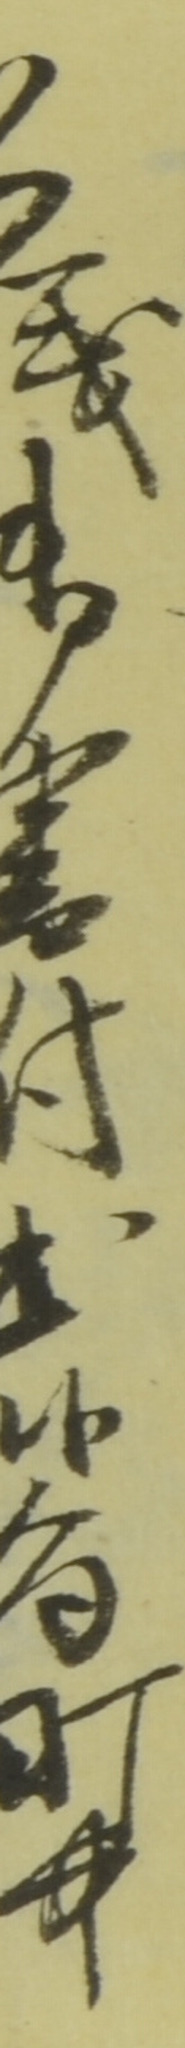公儀御書付出候間町中

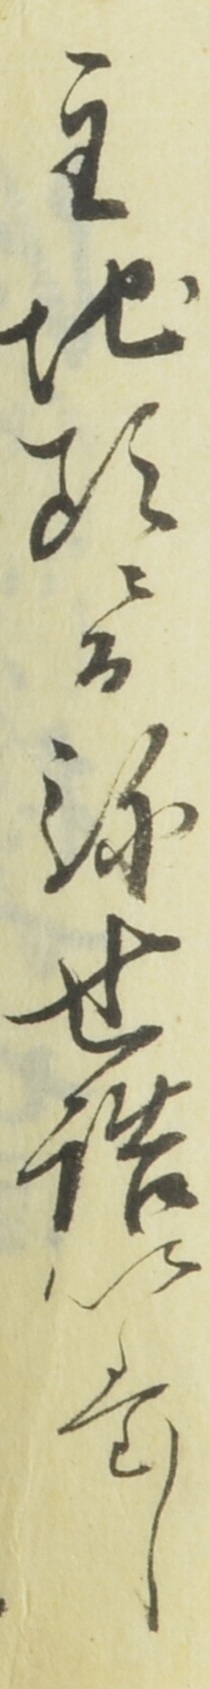主地頭ニ而弥世話いたし
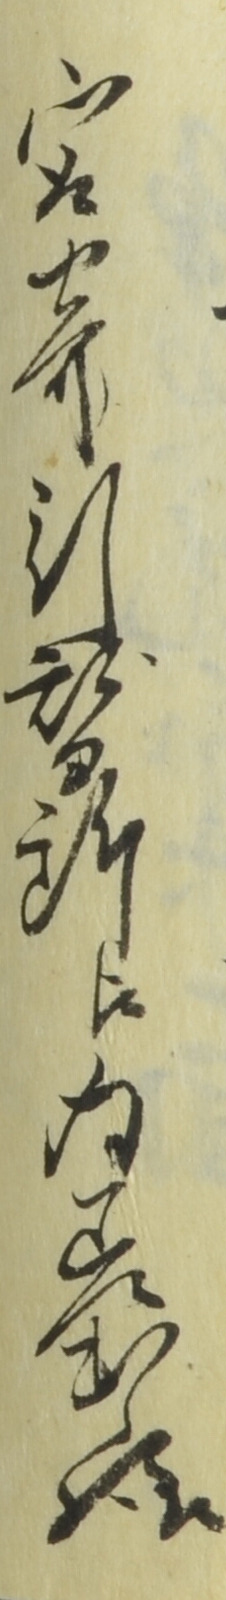最寄引替所江為差出候様
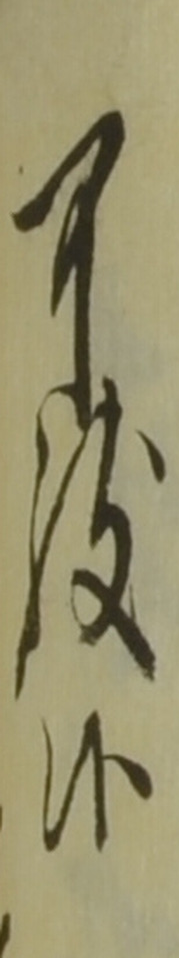可致候
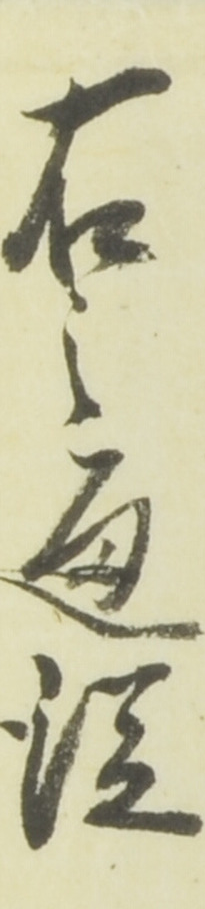右之通従
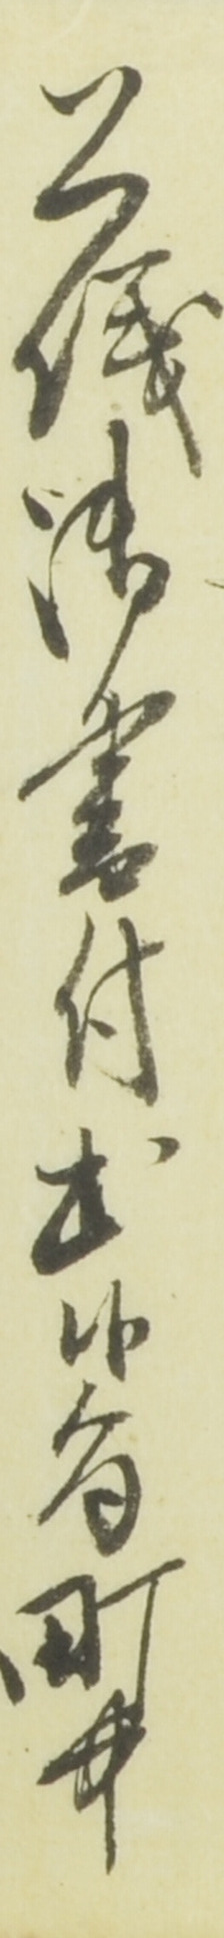公儀御書付出候間町中
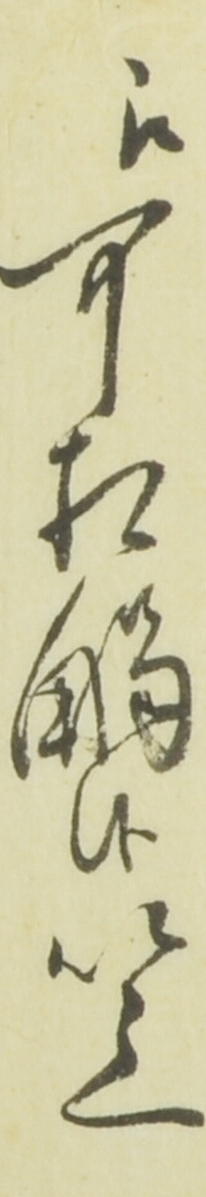江可相触候以上
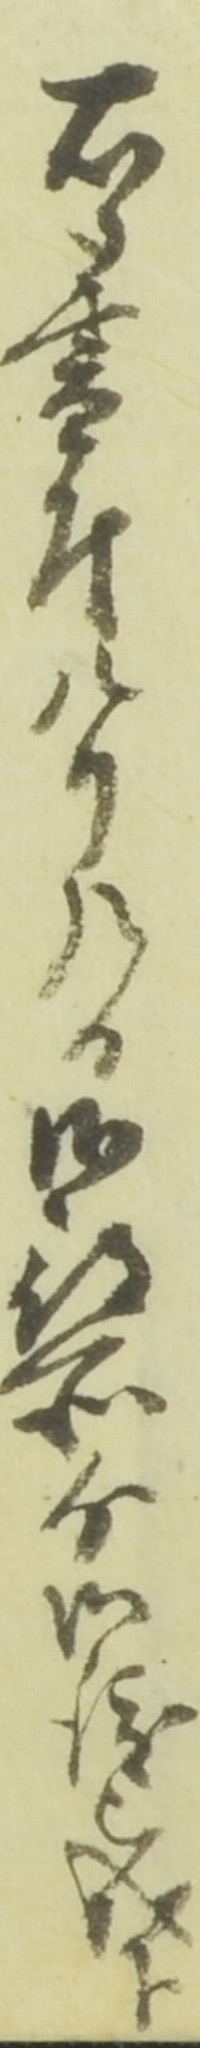右御書付八月八日御役所ゟ御渡被成下
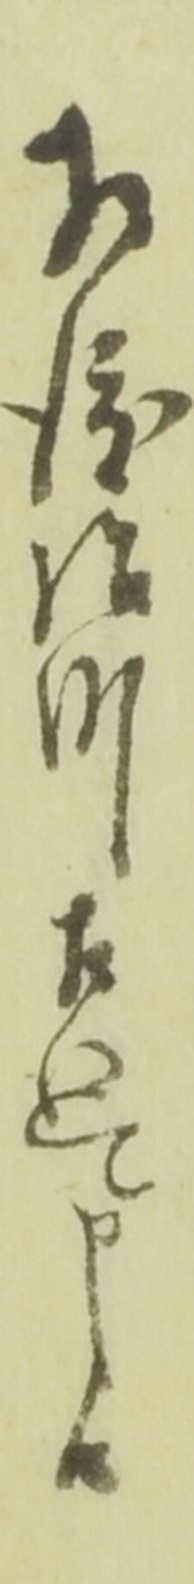相渡拾町相廻シ申候
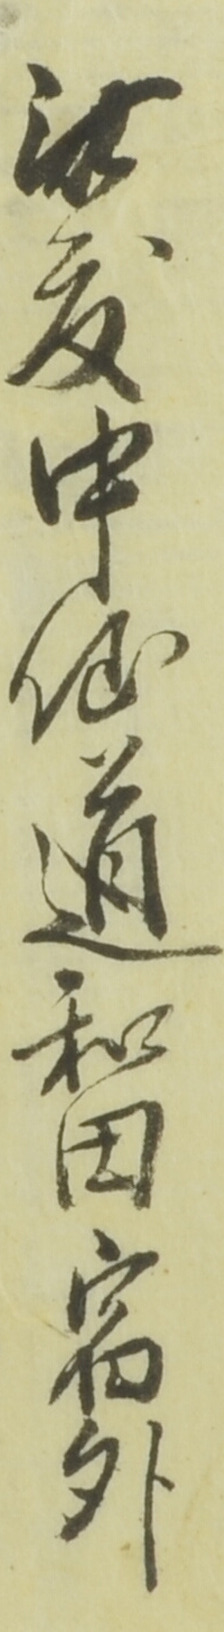此度中仙道和田宿外
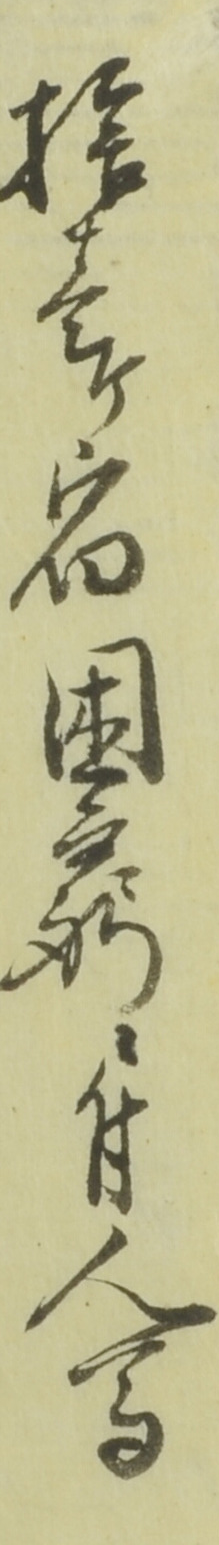拾壱ヶ宿困窮ニ付人馬
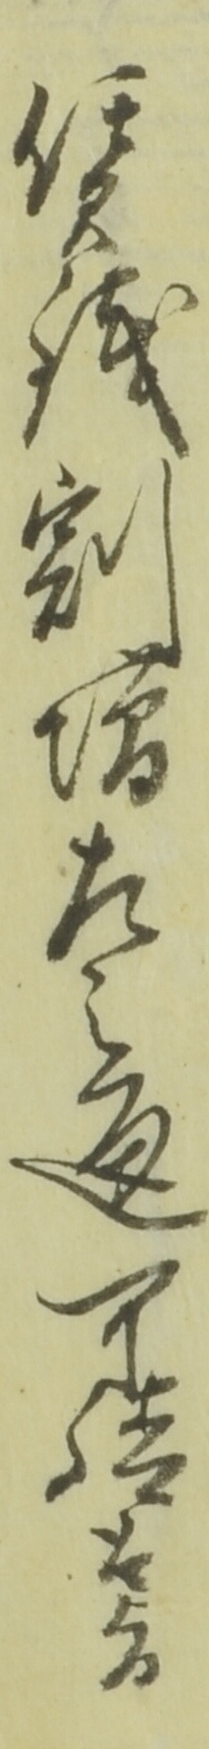賃銭割増左之通可請取旨
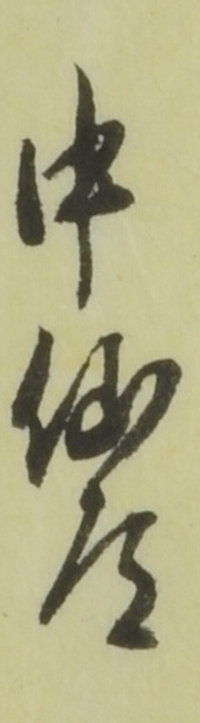中仙道
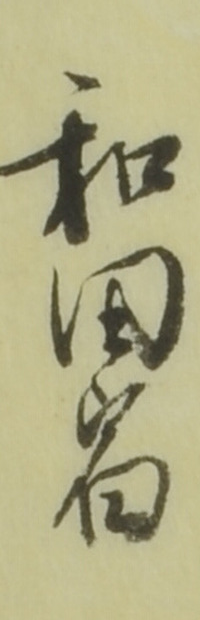和田宿
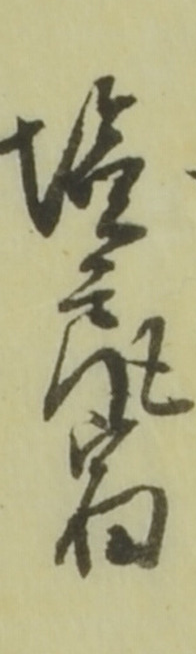塩尻宿
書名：御触書御書附控
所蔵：伊那市立高遠町図書館・合同会社AMANE
